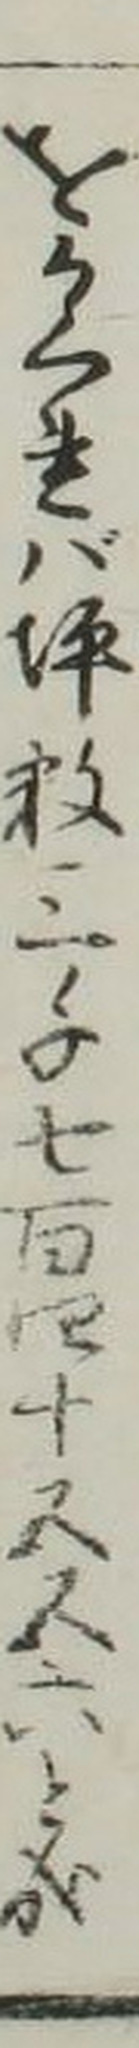をかくれば坪数三千七百四十五五六と成
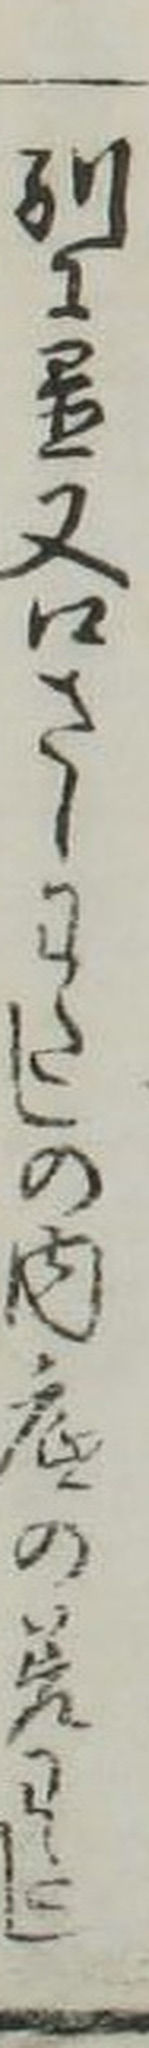別に置又口さしわたしの内底の差わたし
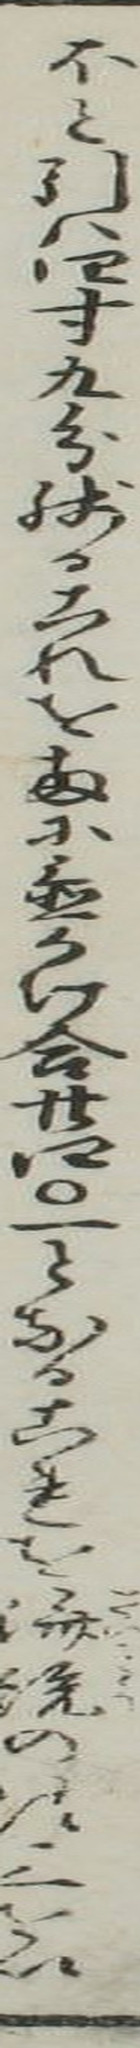ほと引は四寸九分残るこれを両に置かけ合廿四〇一と成なるこれを済統の法三を以
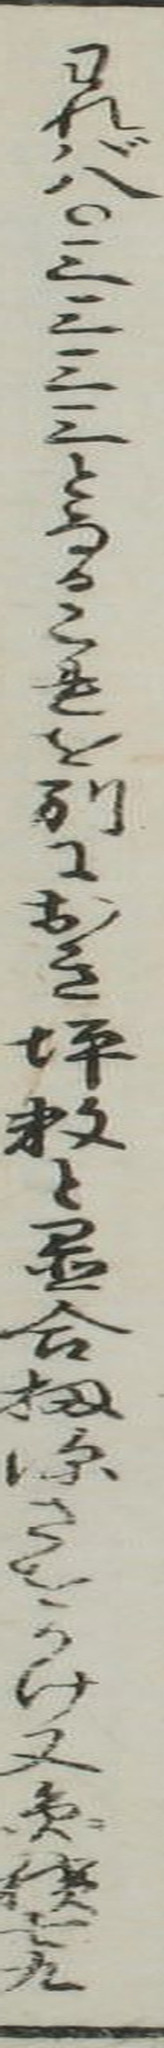われば八〇三三三三となるこれを別におき坪数と置合扨深さをかけ又円積七九

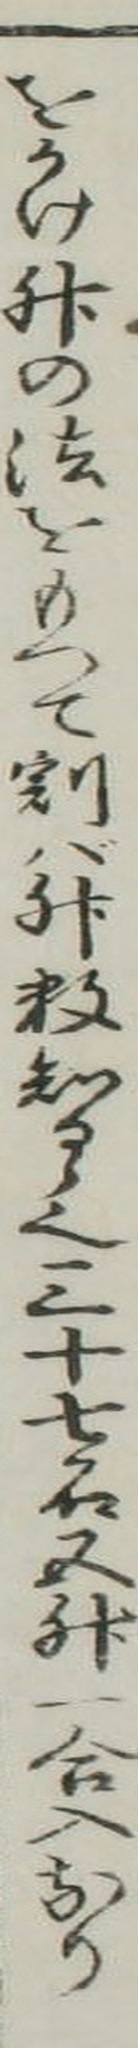をかけ升の法をもつて割ば升数知るゝ也三十七石五升一合入なり
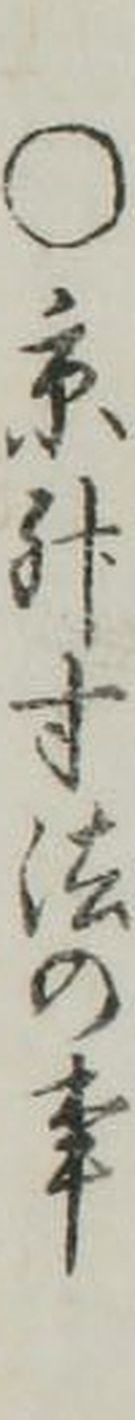○京升寸法の事
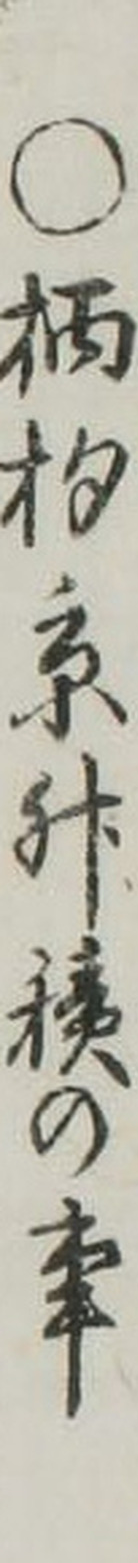○柄杓京升積の事
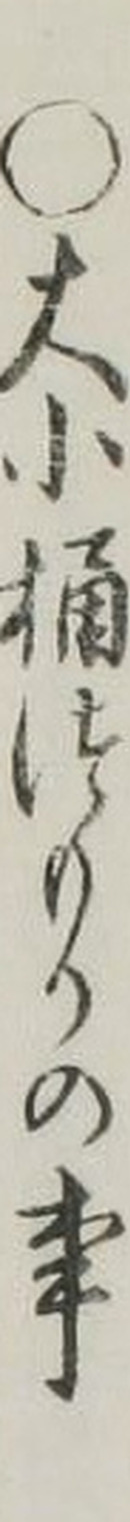○大小桶つもりの事
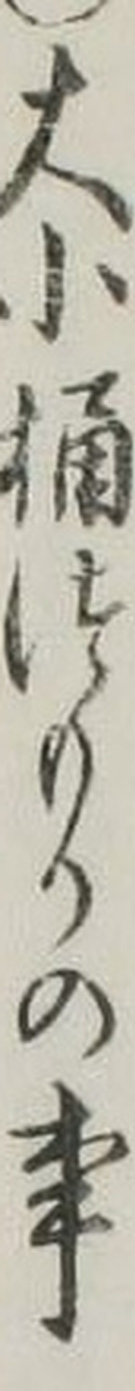○大小桶つもりの事
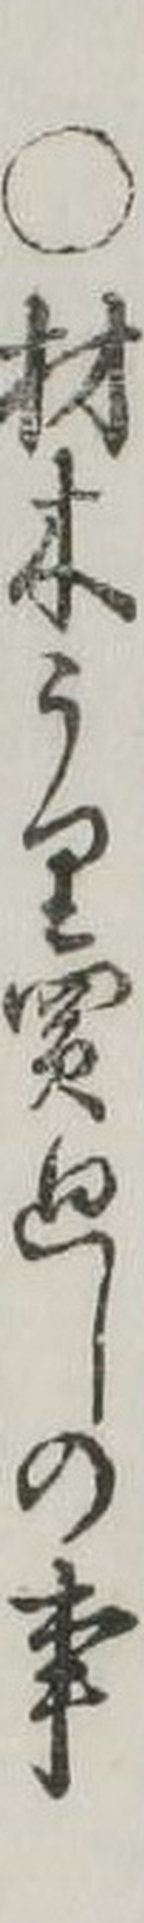○材木うり買廻しの事
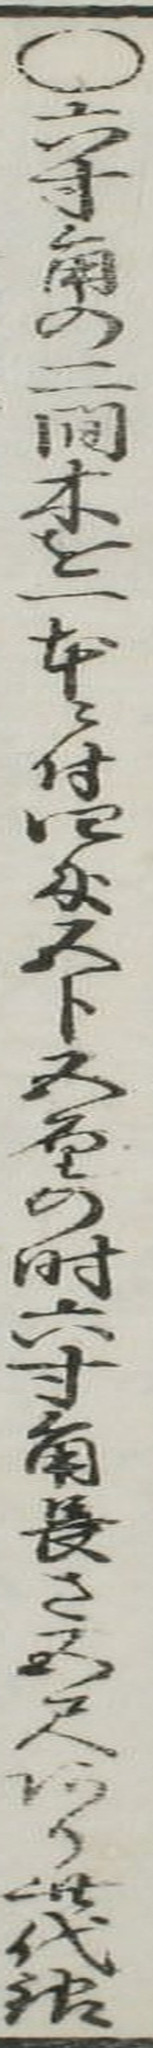○六寸角の二間木を一本に付四匁五分五厘の時六寸角長さ五尺あり此代銀
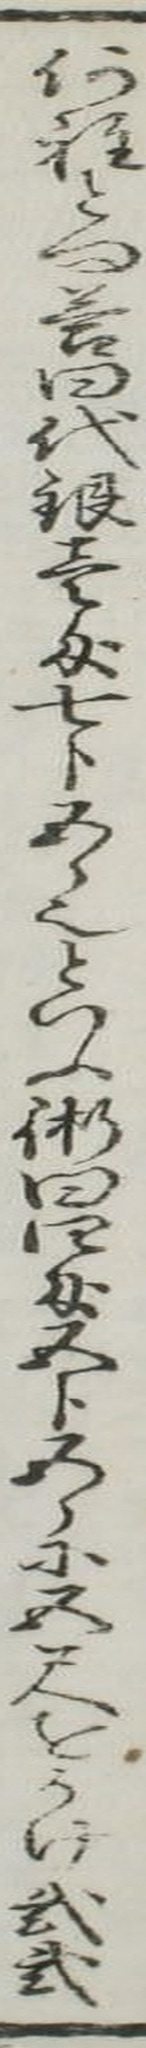何程と問答曰代銀壱匁七分五厘也といふ術曰四匁五分五厘に五尺をかけ弐弐
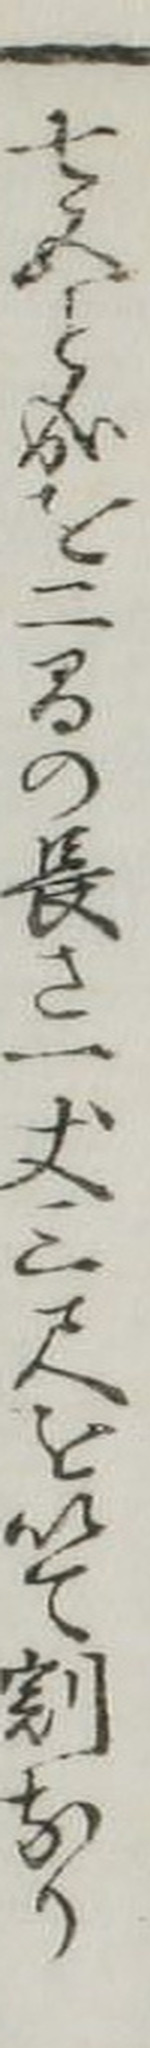七五と成を二間の長さ一丈三尺を以て割なり
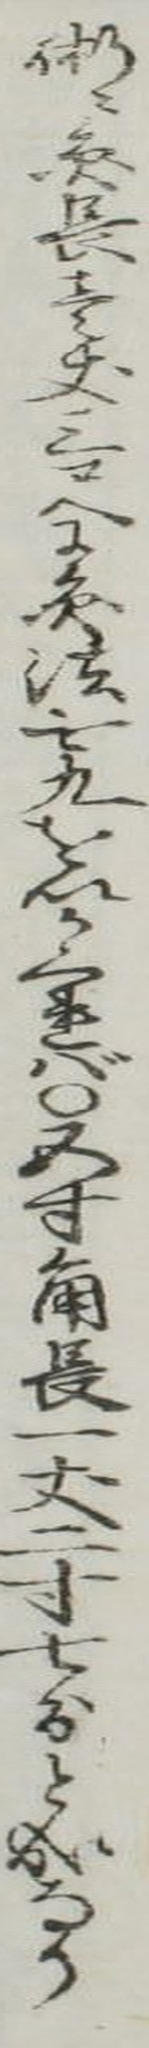術に円長壱丈三尺に円法七九を以かくれば〇五寸角長一丈二寸七分と成なり
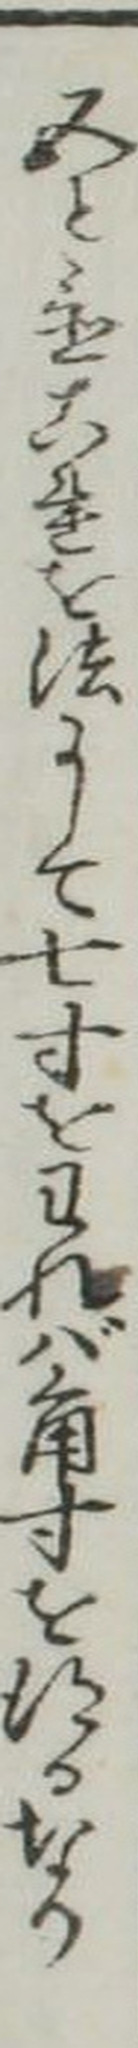五と置これを法にして七寸をわれば角寸を得るなり
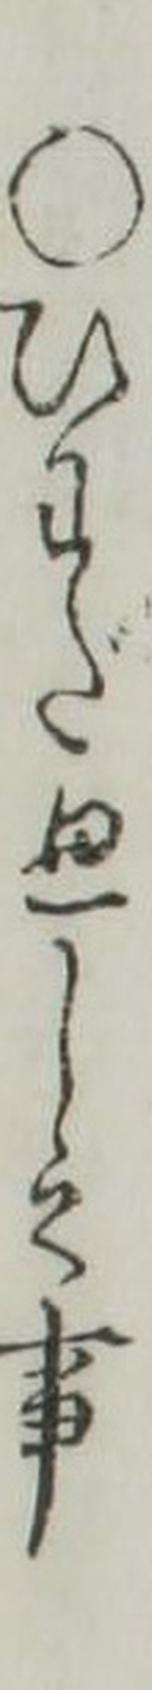○ひわだ廻し之事
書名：宝玉塵劫記
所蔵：東京学芸大学教育コンテンツアーカイブ
